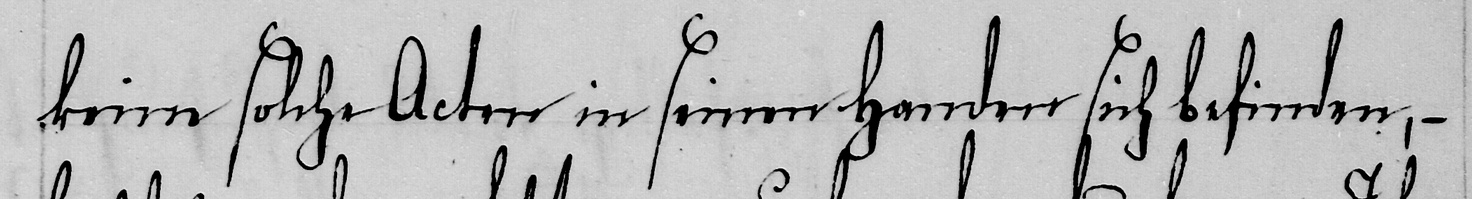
keine solche Acten in seinen Handen sich befinden, –
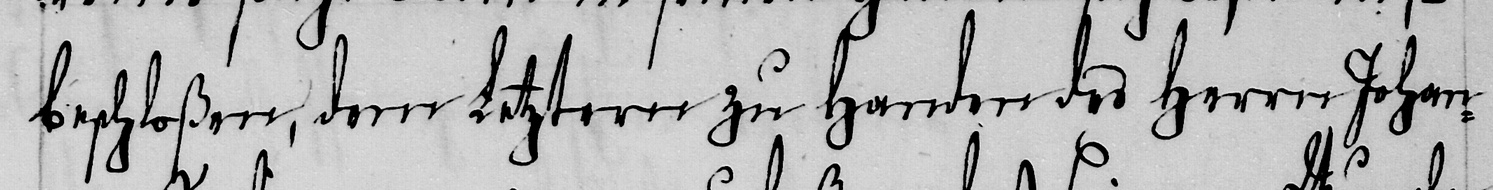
beschloßen, dem Letztern zu Handen des Herrn Johan¬
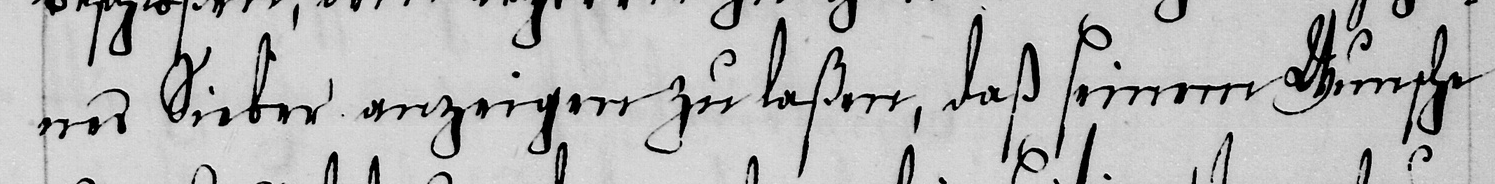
nes Sieber anzeigen zu laßen, daß seinem Wunsche
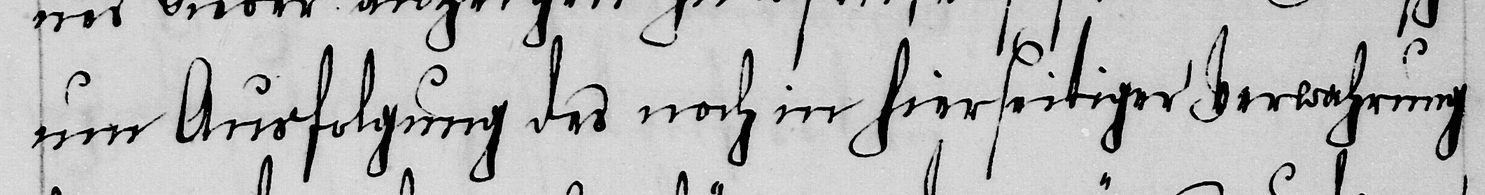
um Ausfolgung des noch in hierseitiger Verwahrung
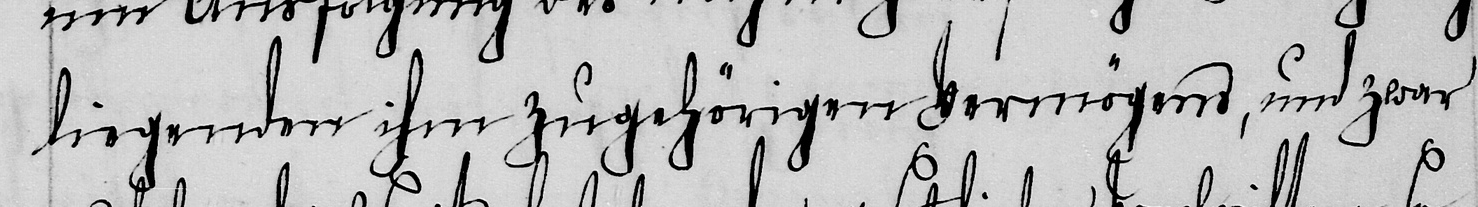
liegenden ihm zugehörigen Vermögens, und zwar
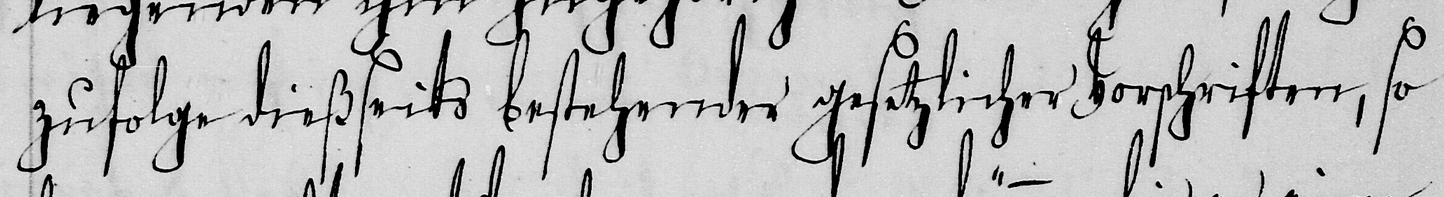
zufolge dießseits bestehender gesetzlicher Vorschriften, so
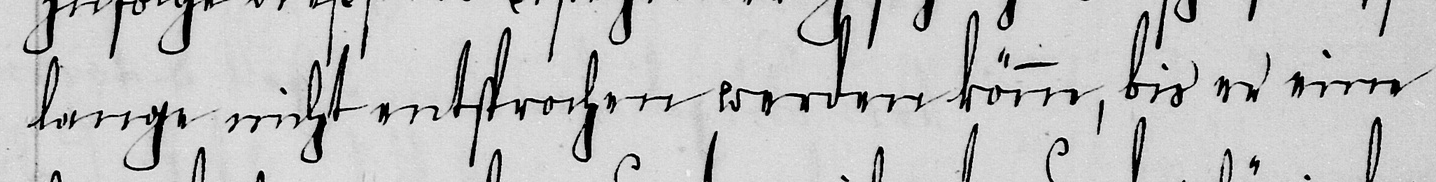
lange nicht entsprochen werden könne, bis er eine
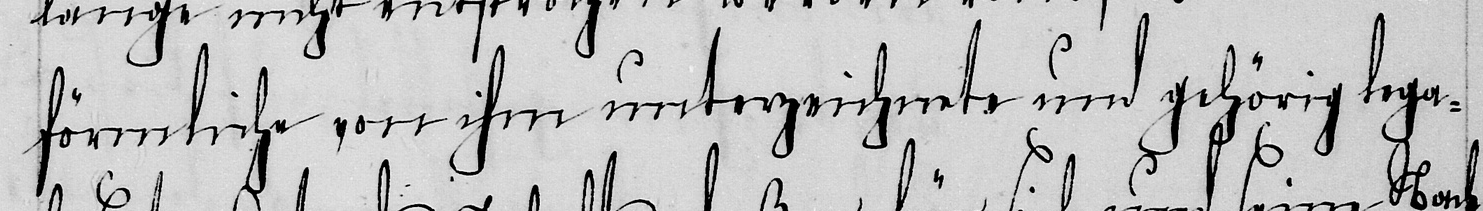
förmliche von ihm unterzeichnete und gehörig lega¬
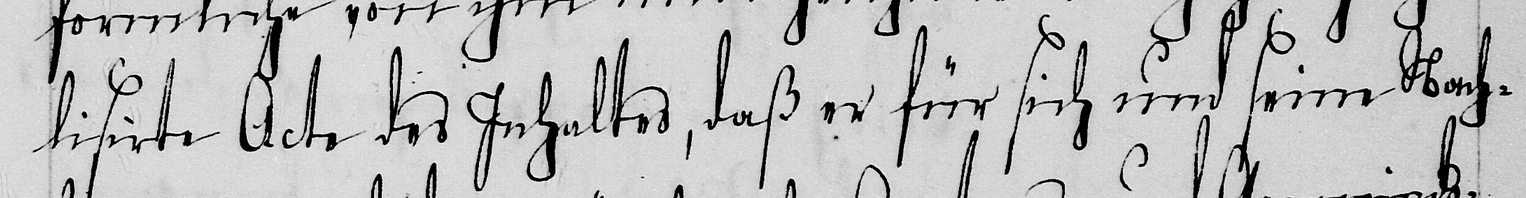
lisirte Acte des Inhaltes, daß er für sich und seine Nach¬
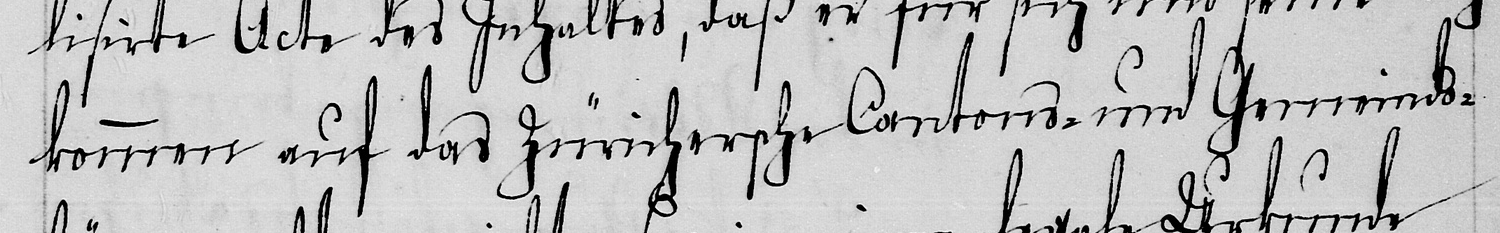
kommen auf das Zürichersche Cantons- und Gemeinds¬
